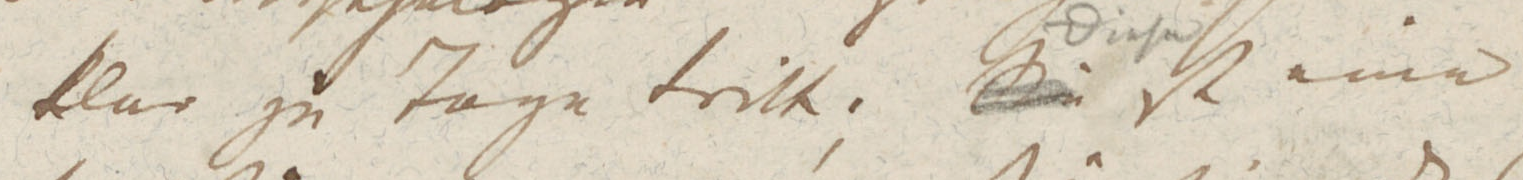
klar zu Tage tritt; Sie Diese ist eine
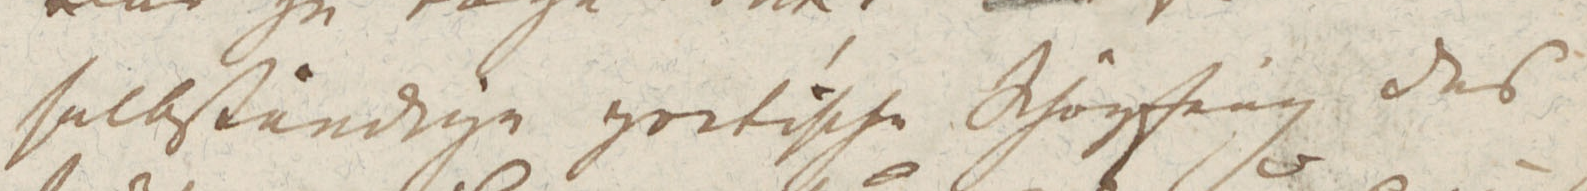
selbständige poetische Schöpfung des
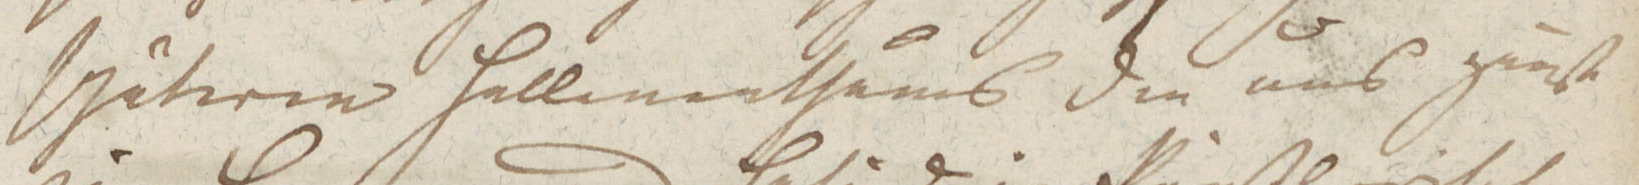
späteren Hellenenthums die uns zuerst
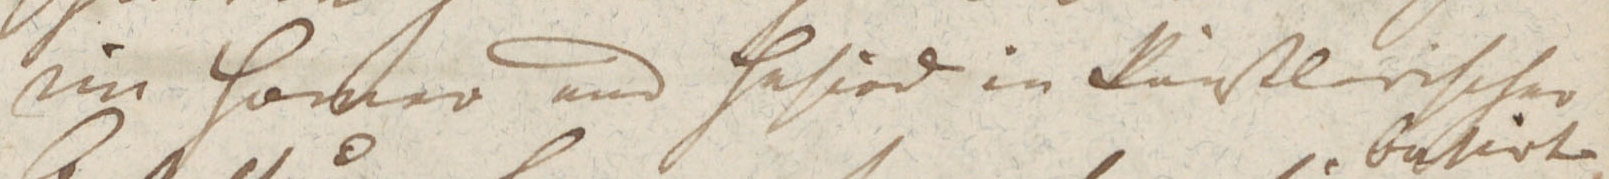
im Homer und Hesiod in künstlerischer
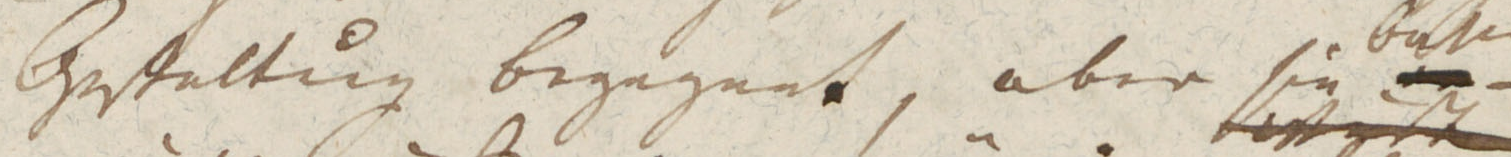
Gestaltung begegnet, aber sie er-
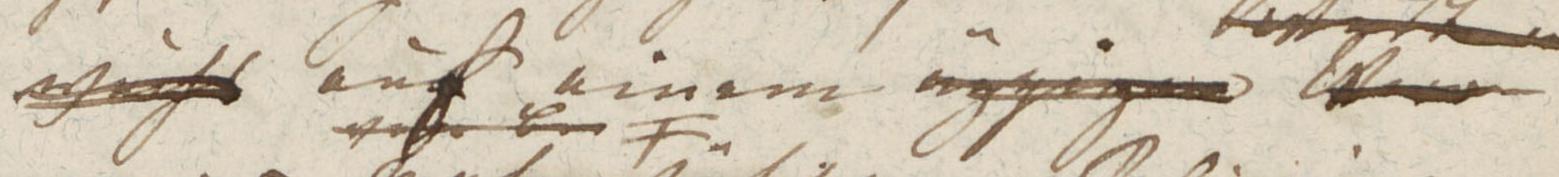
wächs ausf einem üppigen Wirr-
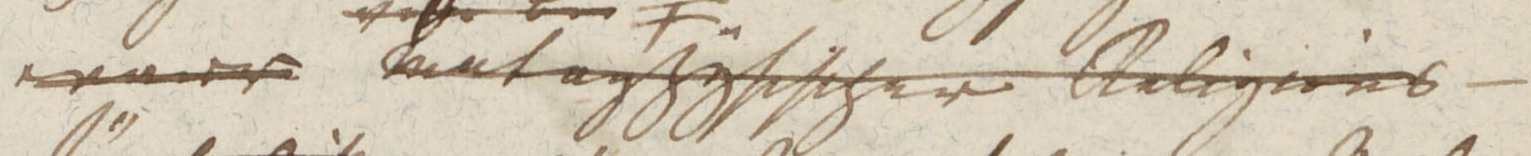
warr metaphysischer Religions-
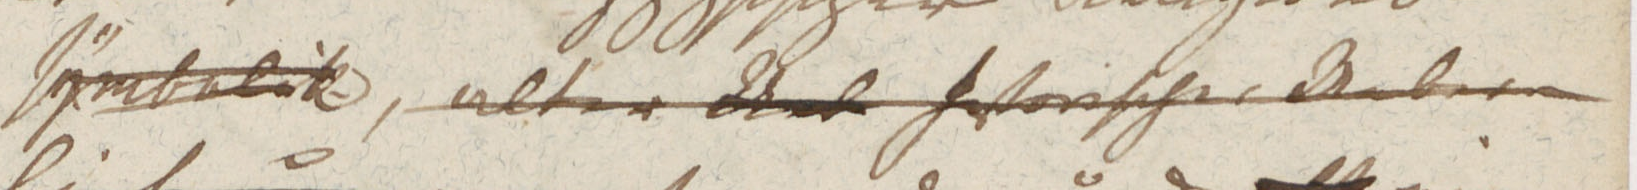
symbolik, alter Ueb historischer Ueber-
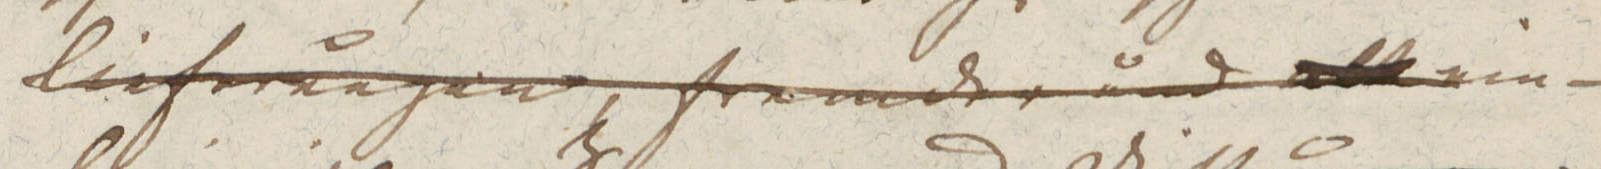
lieferungen, fremder und all ein-
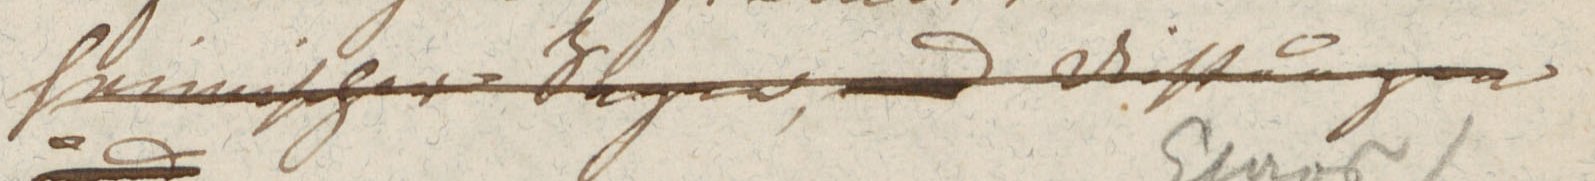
heimischer Sagen, und Dichtungen
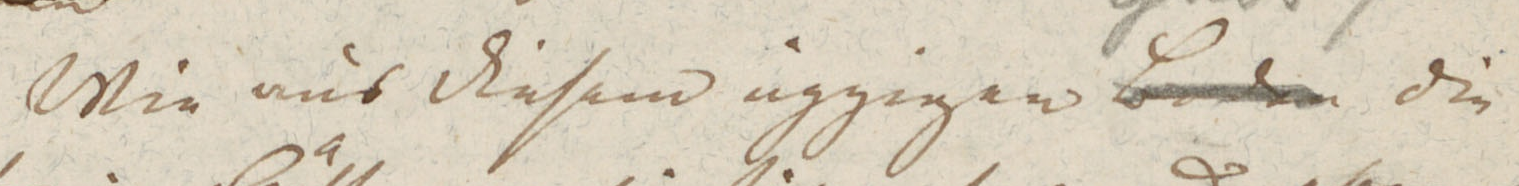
Wie aus diesem üppigen Boden Chaos die
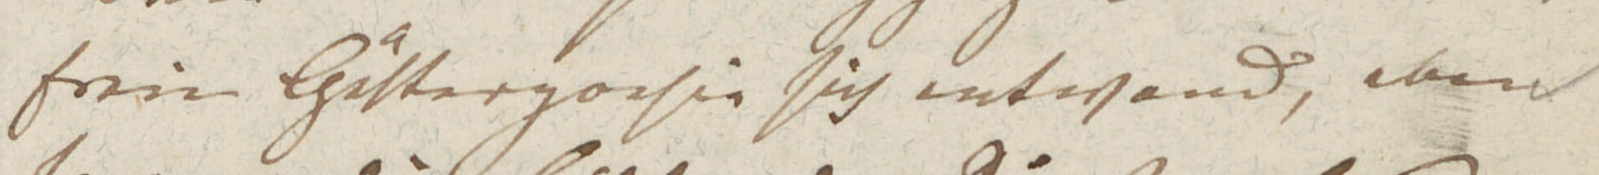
freie Götterpoesie sich entwand, eben
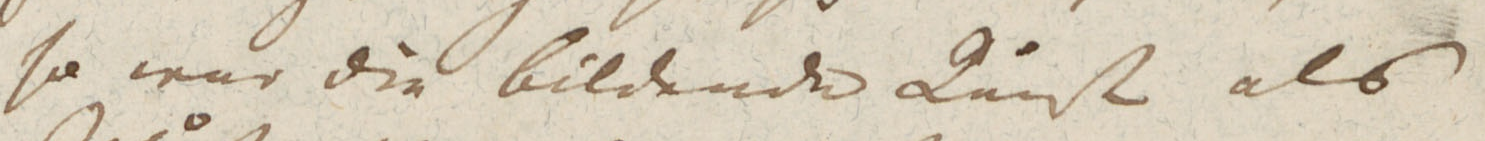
so war die bildende Kunst als
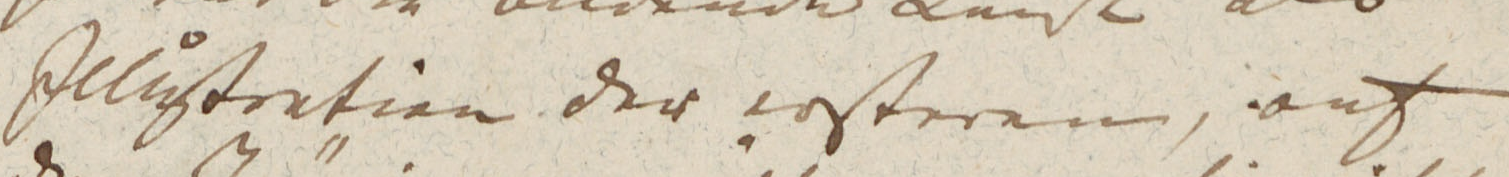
Illustration der ersteren, auf
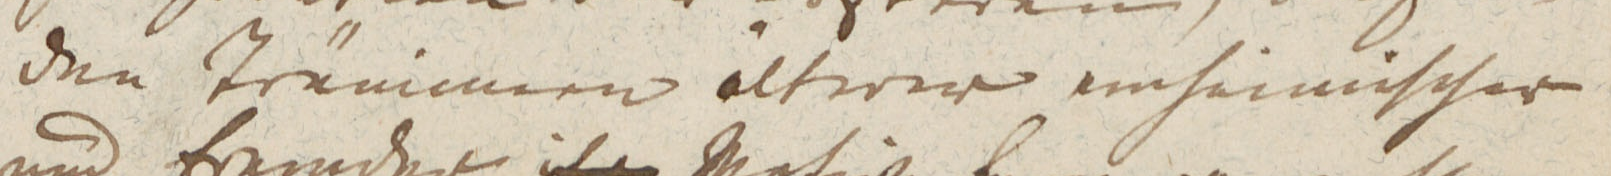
den Trümmern älterer einheimischer
